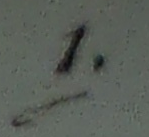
1.
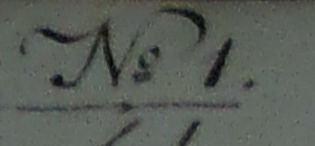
No͇ 1.
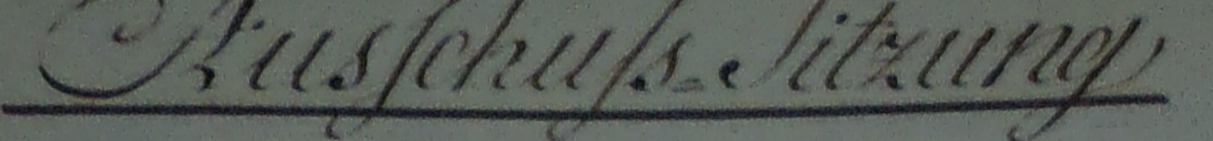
Ausschuss‗Sitzung
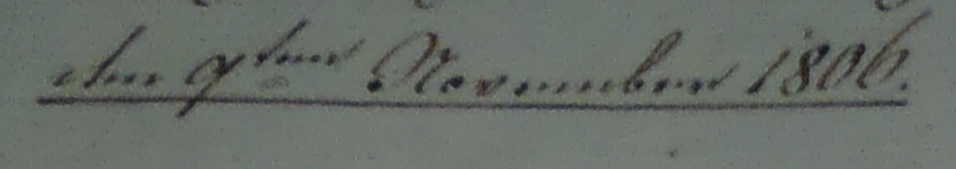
den 9te͇n November 1806.
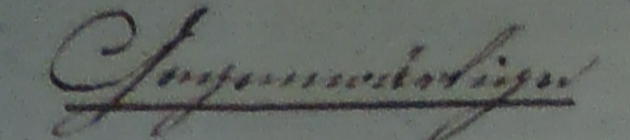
Gegenwärtige
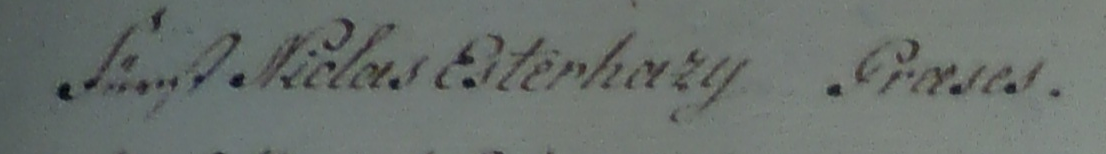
Fürst Niclas Esterhazy Præses.
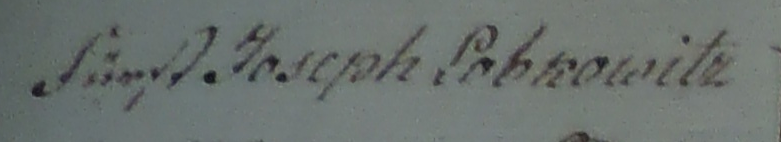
Fürst Joseph Lobkowitz
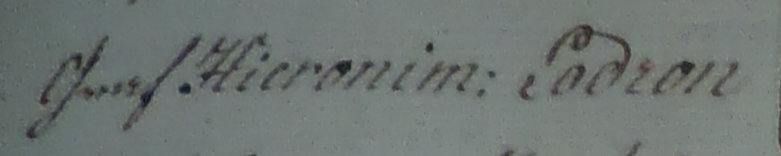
Graf Hieronim: Lodron
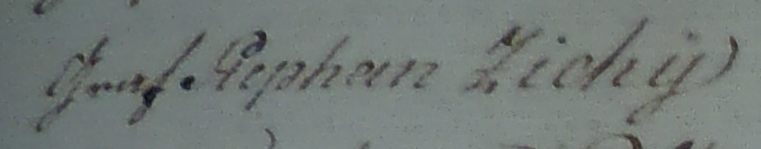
Graf Stephan Zichy
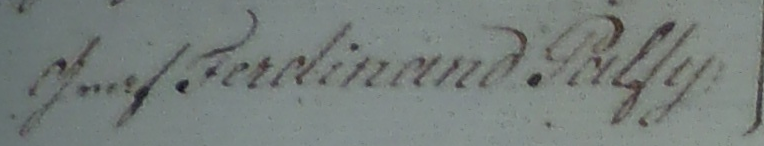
Graf Ferdinand Palfy
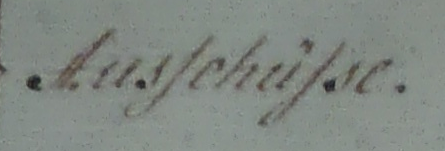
Ausschüsse.
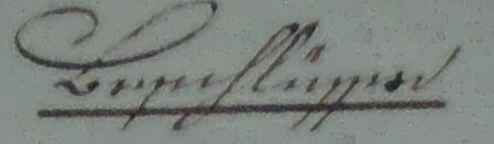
Beschlüsse
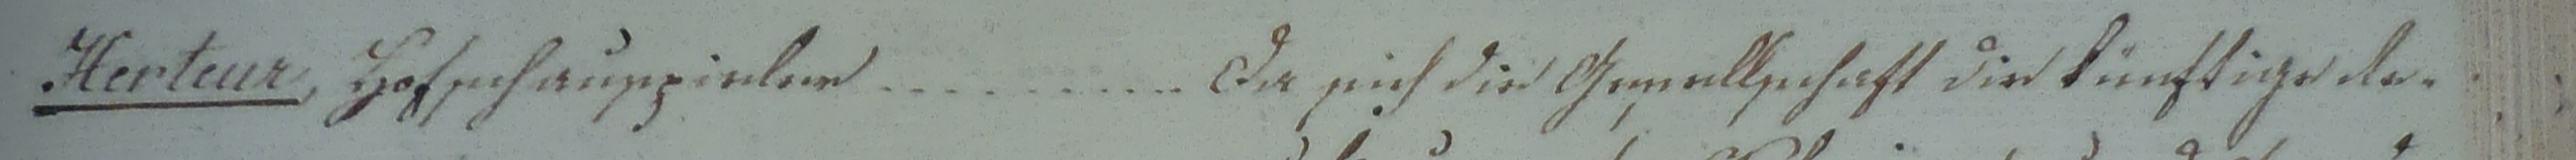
Herteur, Hofschauspieler ………. Da sich die Gesellschaft die künftige Re¬
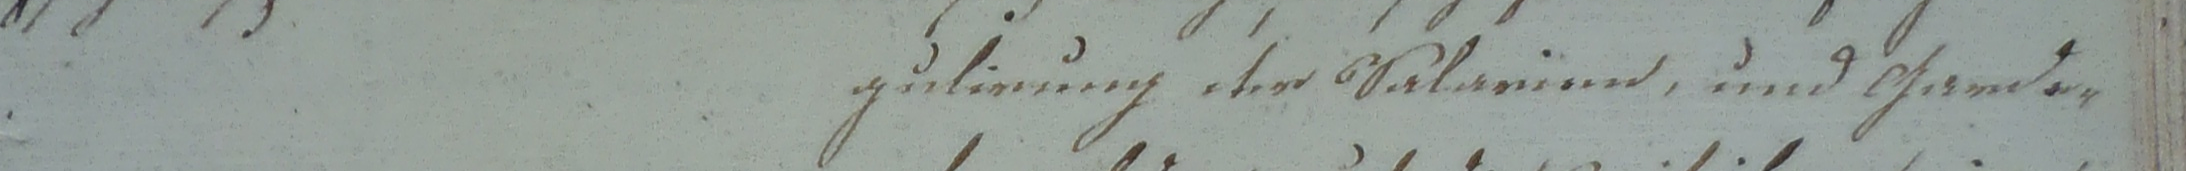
gulirung der Salarien, und Garde¬
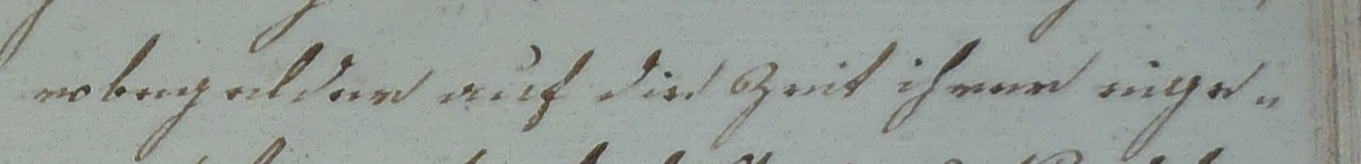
robegelder auf die Zeit ihrer eige¬
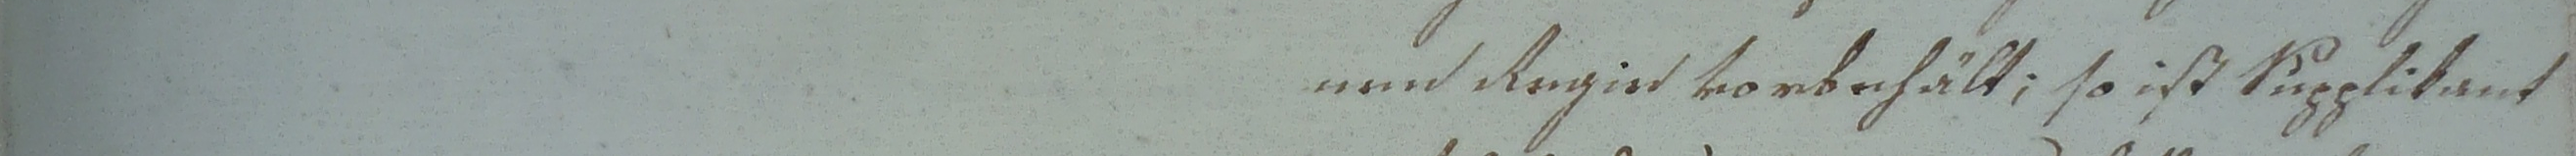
nen Regie vorbehält; so ist Supplikant
